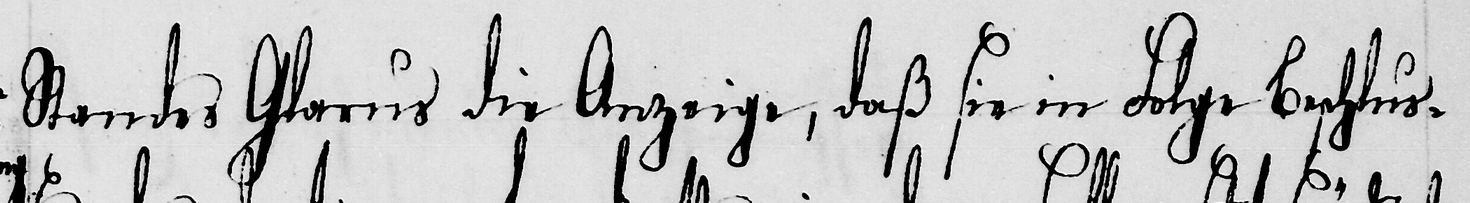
Standes Glarus die Anzeige, daß sie in Folge Beschlu¬
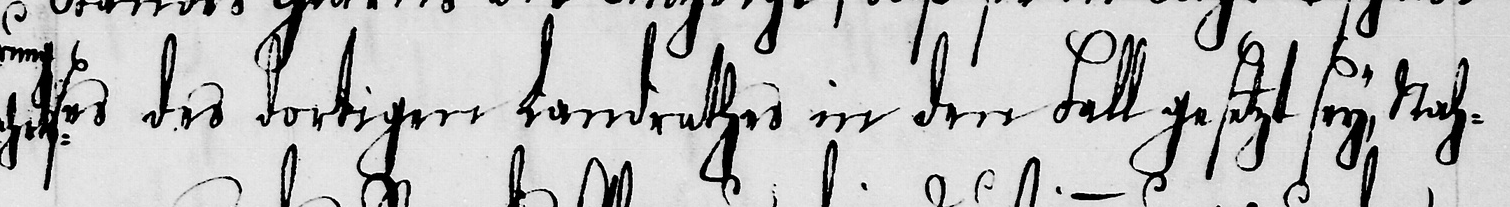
ßes des dortigen Landrathes in den Fall gesetzt sey,
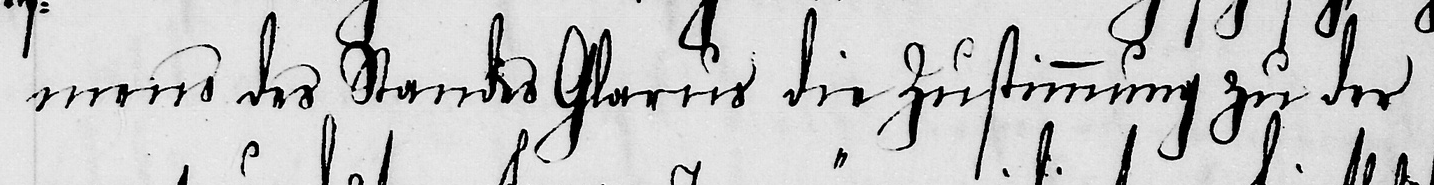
mens des Standes Glarus die Zustimmung zu der
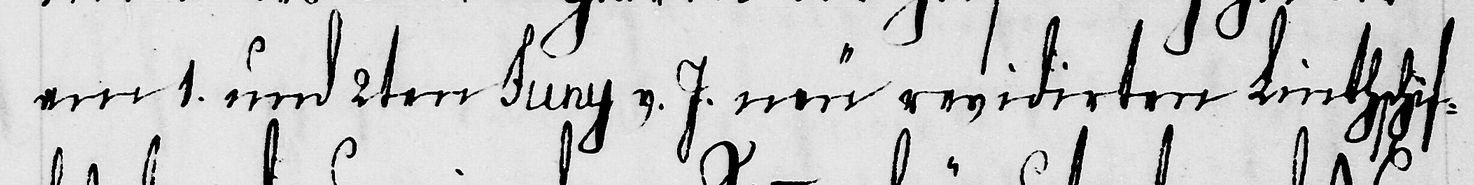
am 1. und 2ten Juny v. J. neu revidirten Linthschif¬
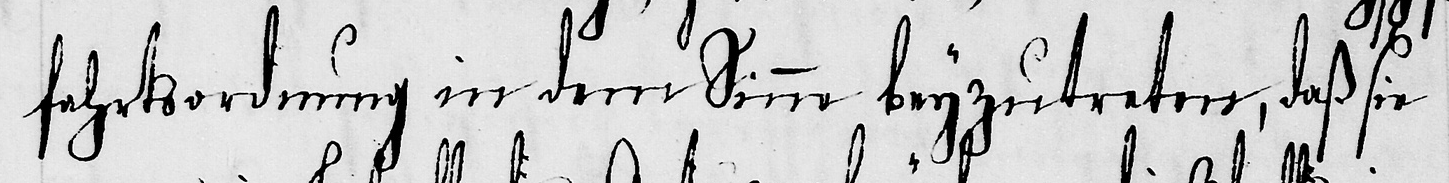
fahrtsordnung in dem Sinne beyzutreten, daß sie
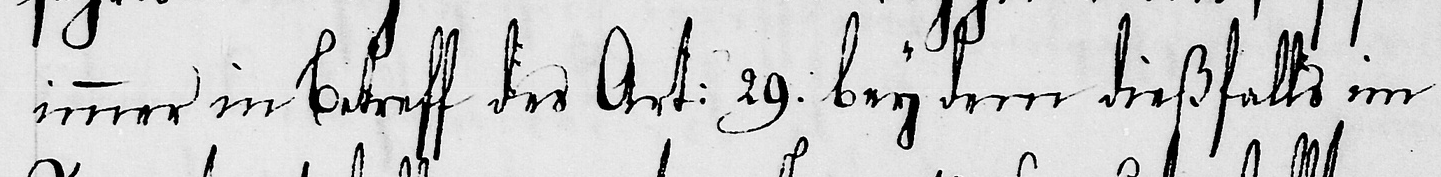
immer in Betreff des Art: 29. bey dem dießfalls im
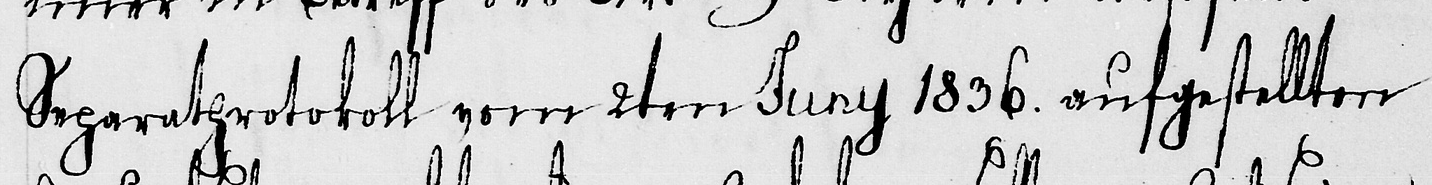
Separatprotokoll vom 2ten Juny 1836. aufgestellten
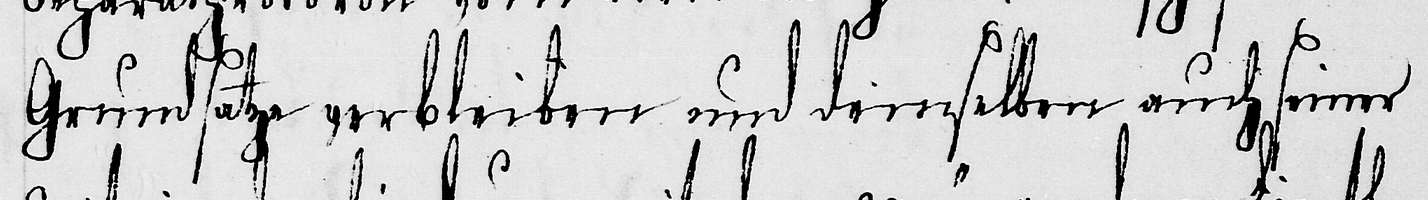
Grundsatze verbleiben und demselben auch seiner
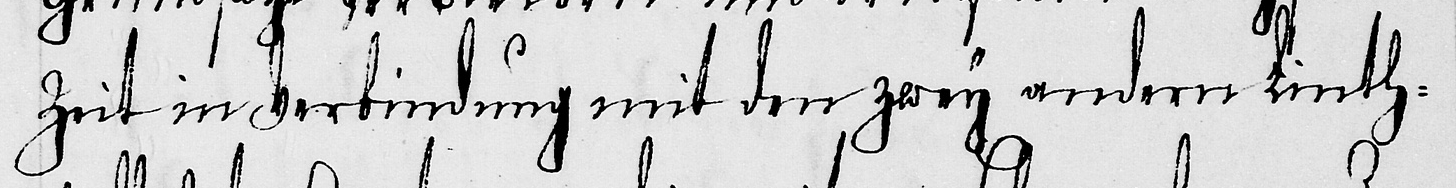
Zeit in Verbindung mit den zwey andern Linth¬
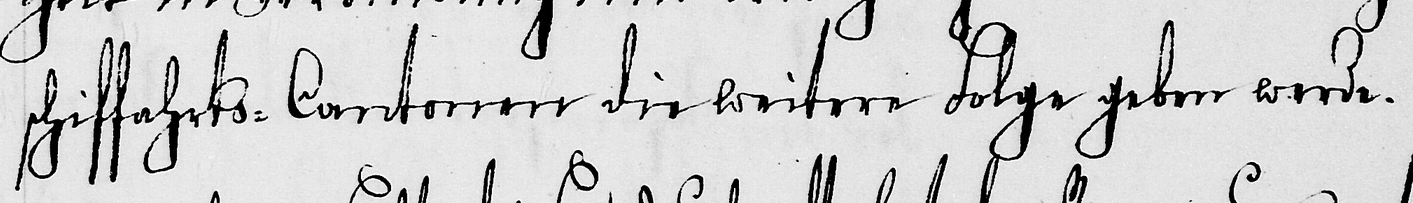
schiffahrts-Cantonen die weitere Folge geben werde.
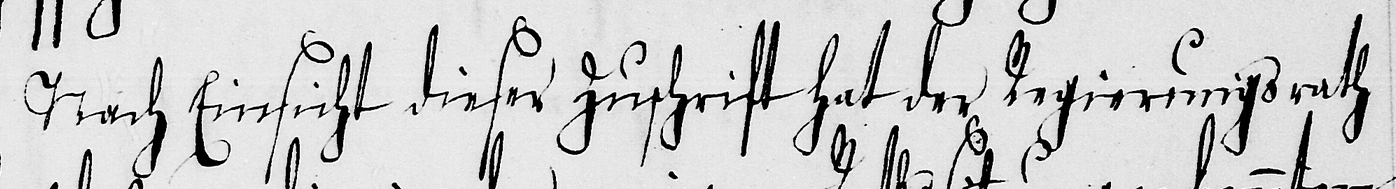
Nach Einsicht dieser Zuschrift hat der Regierungsrath
